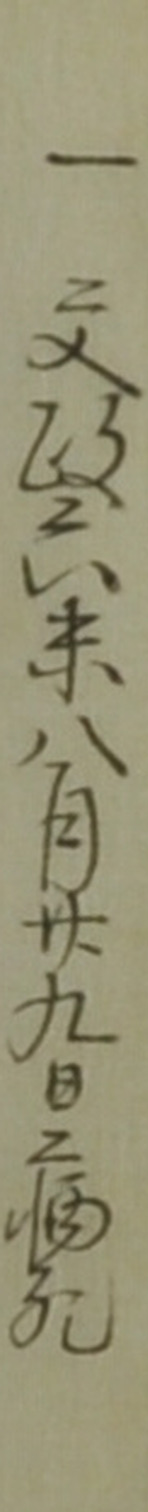一文政六未八月廿九日病死
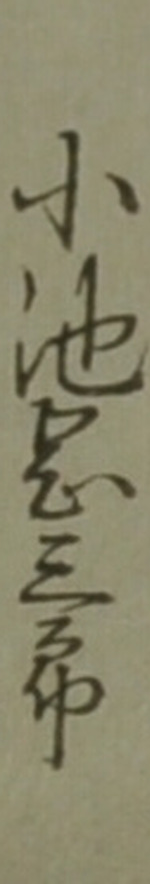小池岡三郎
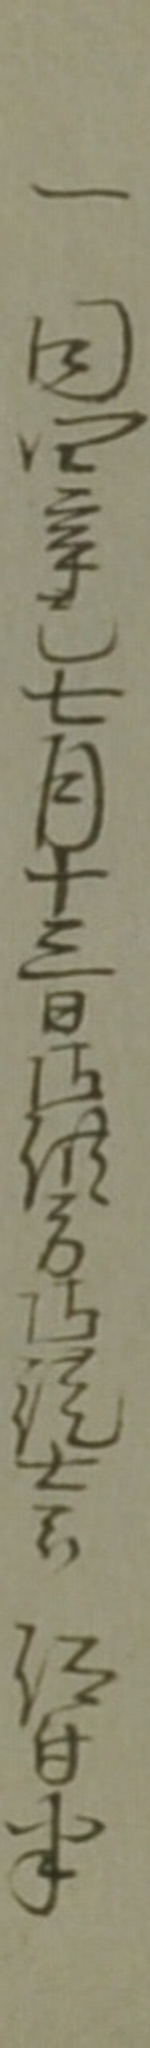一同四辛巳七月十三日御供方御徒士被仰付半
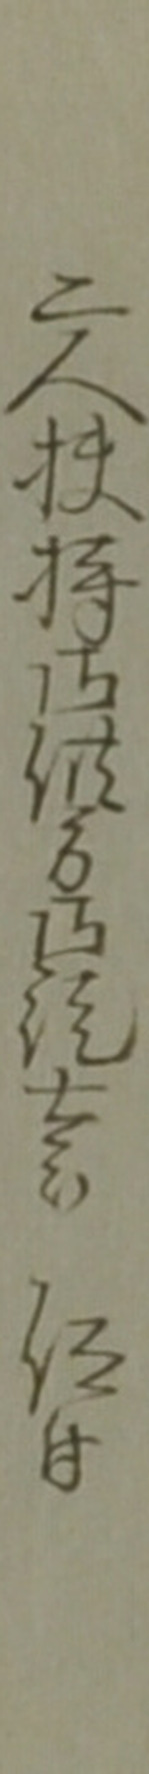二人扶持御供方御徒士被仰付
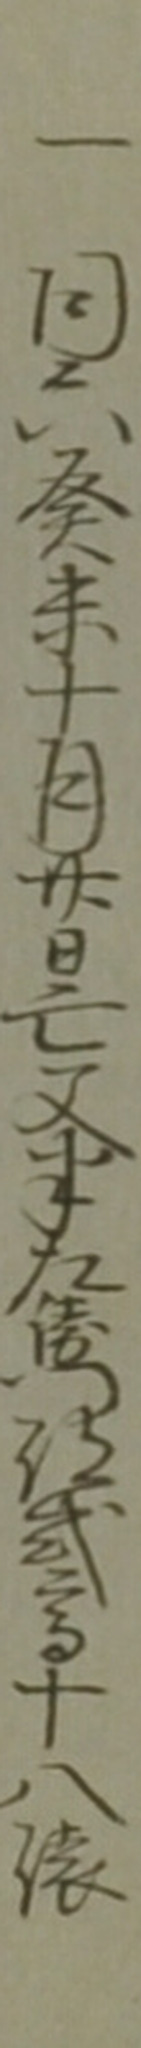一同六癸未十月廿日亡父半左衛門跡式高十八俵
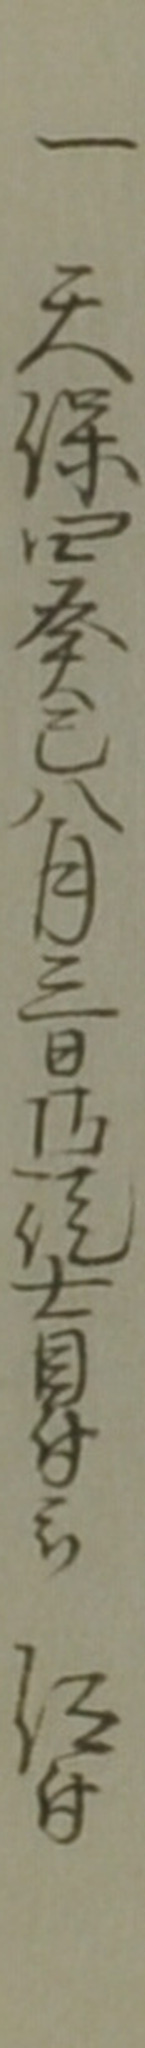一天保四癸巳八月三日御徒士見付被仰付
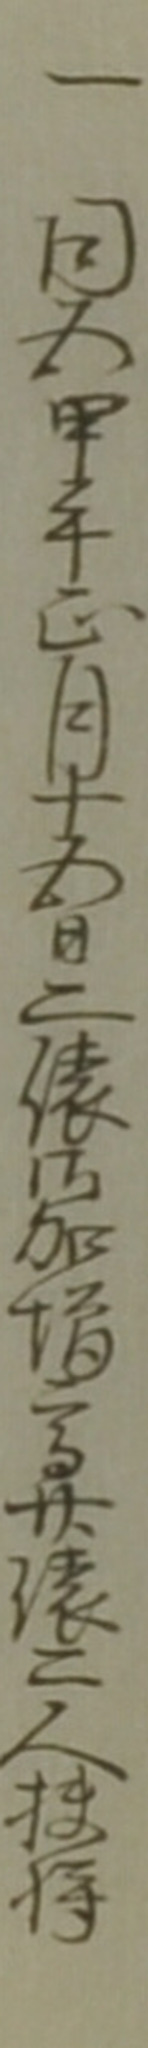一同五甲午正月十五日二俵御加増高廿俵二人扶持
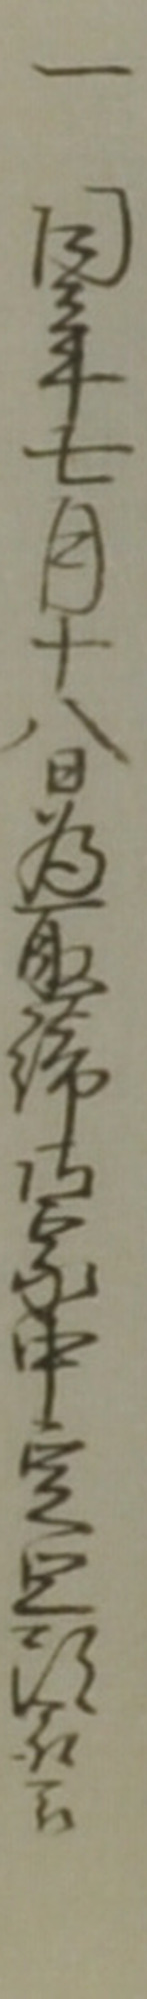一同年七月十八日為取締御家中定廻頭取被
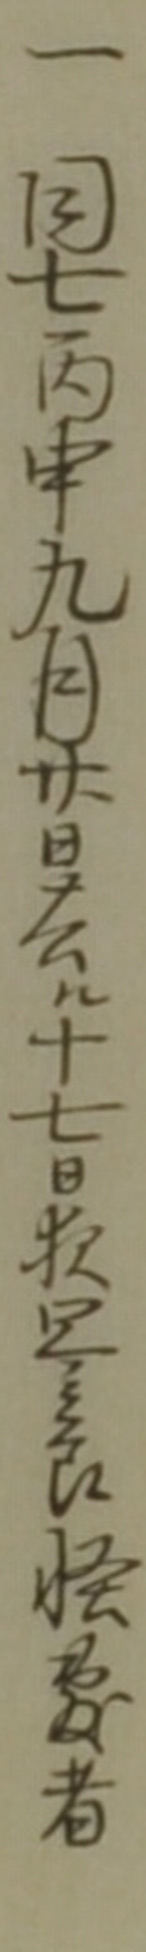一同七丙申九月廿日去ル十七日夜廻之節怪敷者
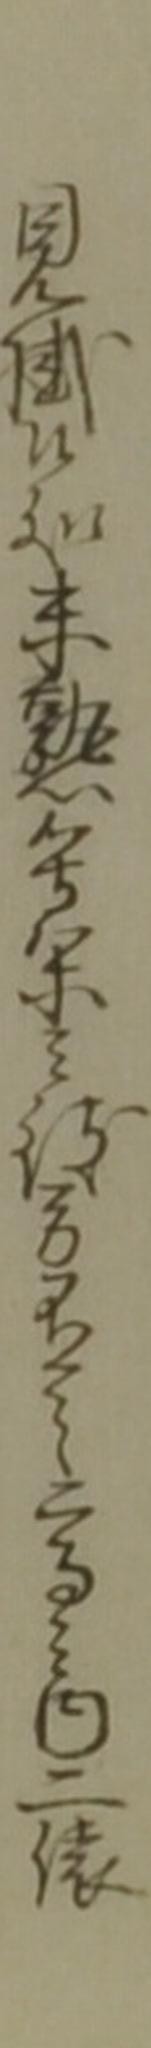見掛候処未熟等閑之致方有之高之内二俵
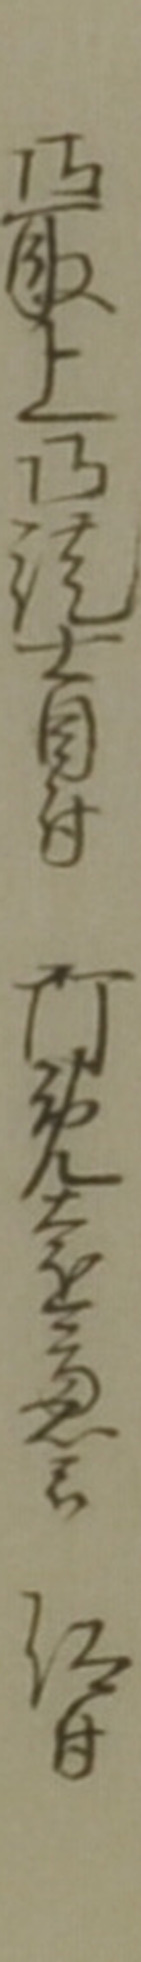御取上御徒士目付御免遠慮被仰付
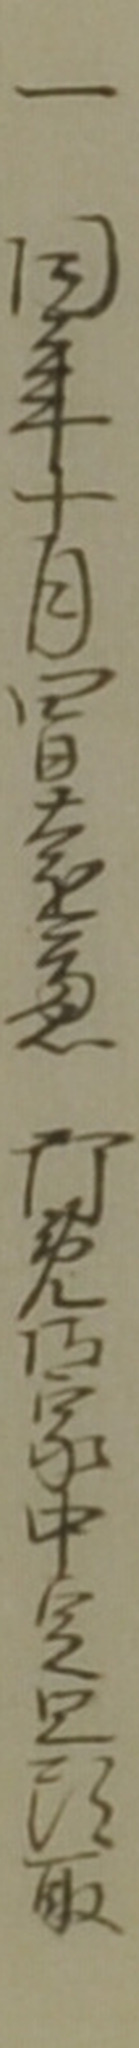一同年十月四日遠慮御免御家中定廻頭取
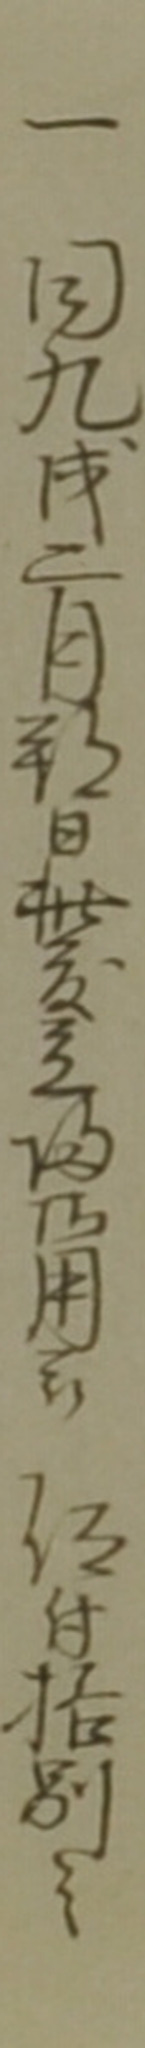一同九戌二月朔日此度立帰御用被仰付格別之
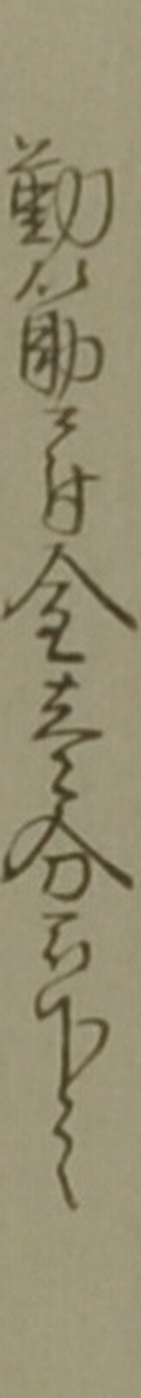勤筋ニ付金壱分被下之
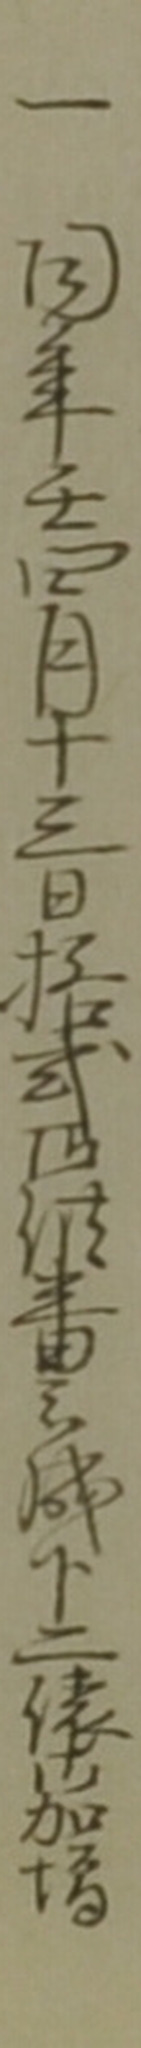一同年閏四月十三日格式御供番被ｎ成下二俵御加増
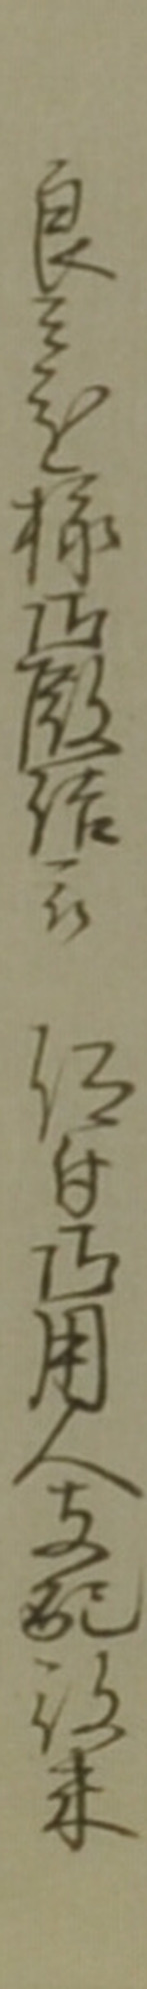良之進様御殿詰被仰付御用人支配役来
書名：無足諸士勤仕録（五）
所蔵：伊那市立高遠町図書館・合同会社AMANE
